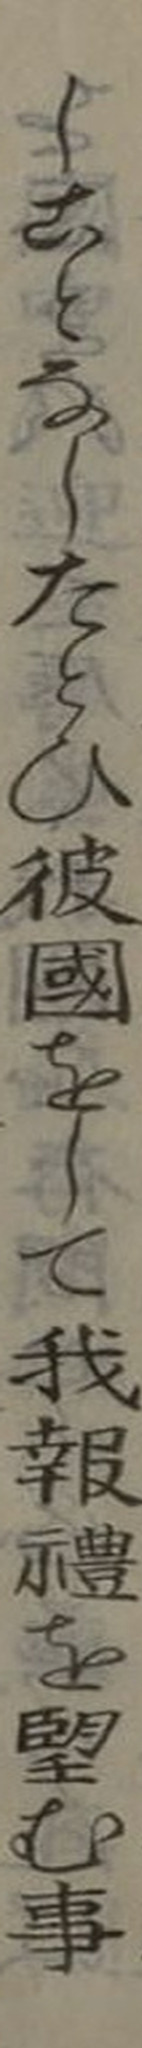しことなしたとひ彼國をして我報禮を朢む事
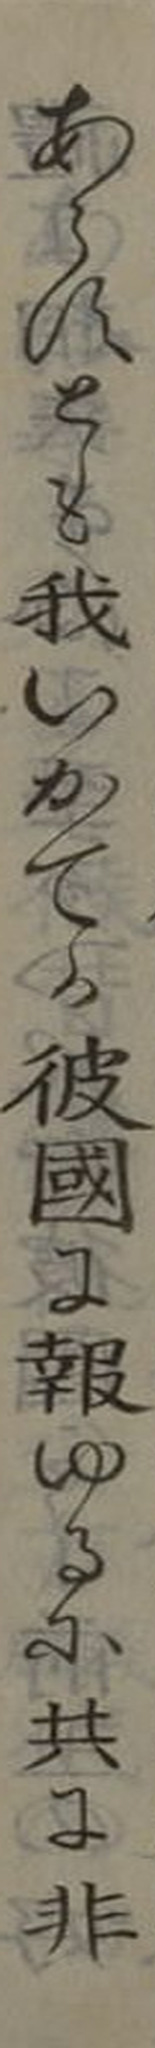あらすとも我いかてか彼國に報ゆるに共に非

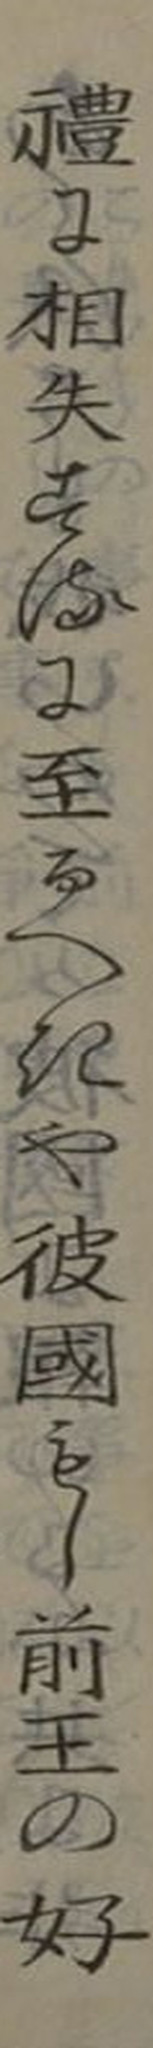禮に相失するに至るへきや彼國もし前王の好
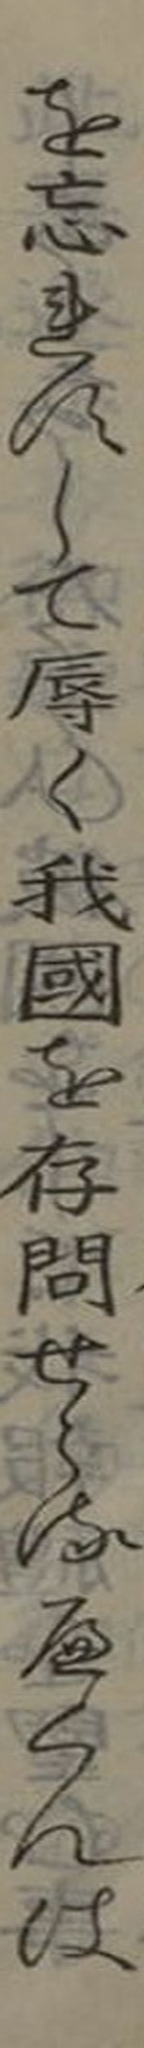を忘れすして辱く我國を存問せらるへくんは
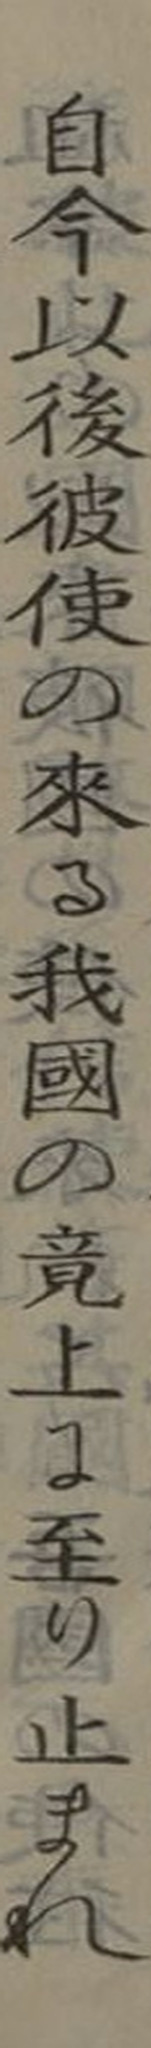自今以後彼使の來る我國の竟上に至り止まれ
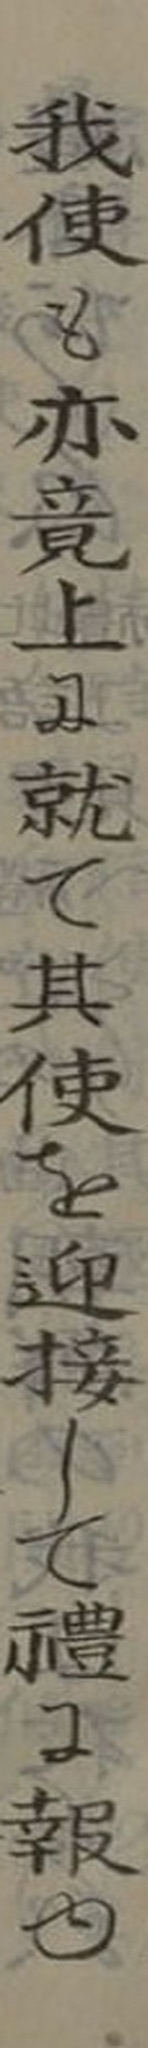我使も亦竟上に就て其使を迎接して禮に報ゆ
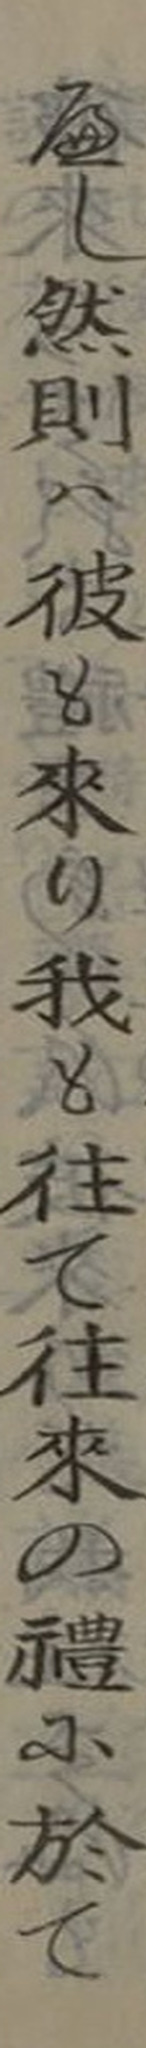へし然則は彼も來り我も往て往來の禮に於て
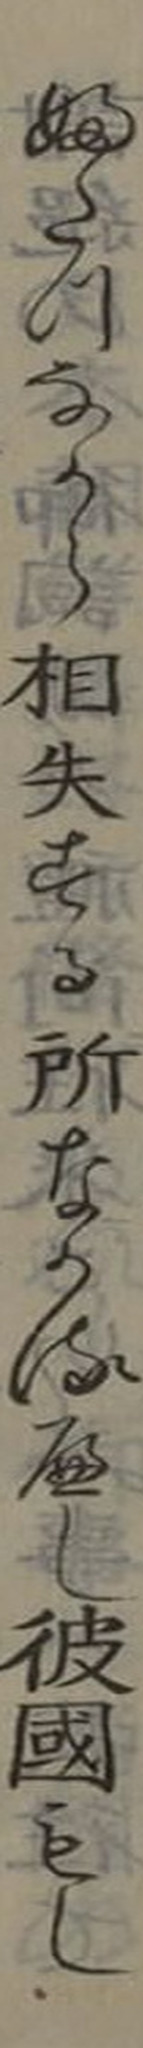ふたつなから相失する所なかるへし彼國もし
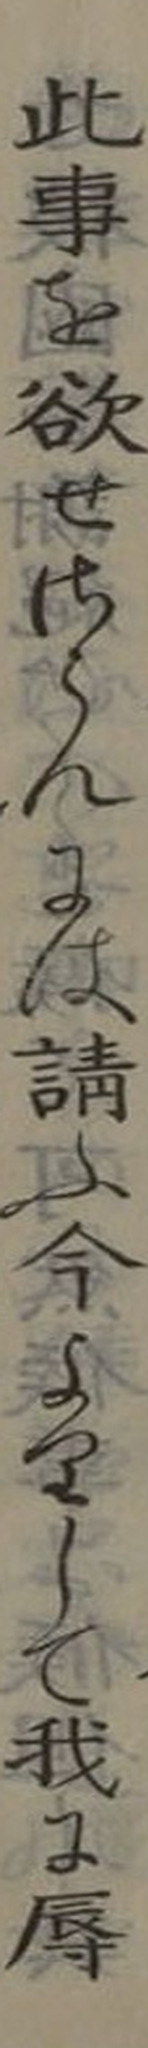此事を欲せさらんには請ふ今よりして我に辱
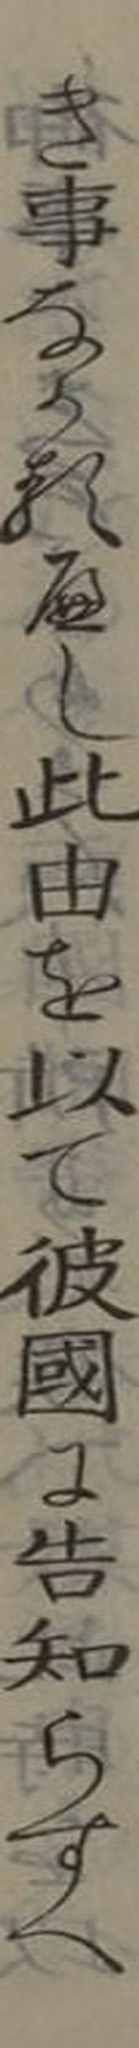き事なかるへし此由を以て彼國に告知らすへ
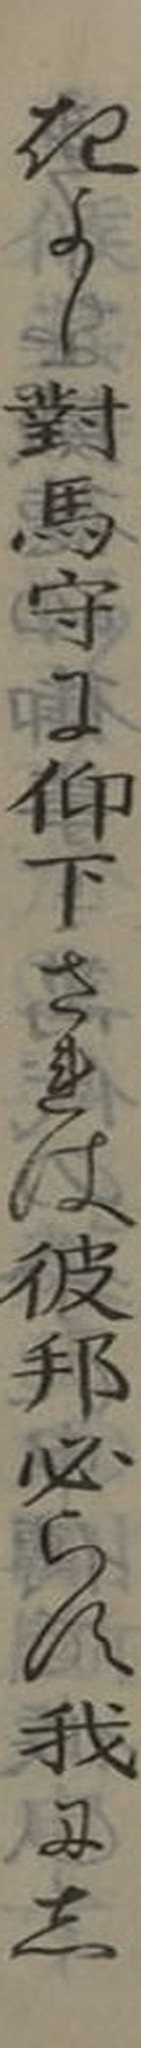きよし對馬守に仰下さるは彼邦必らす我にし
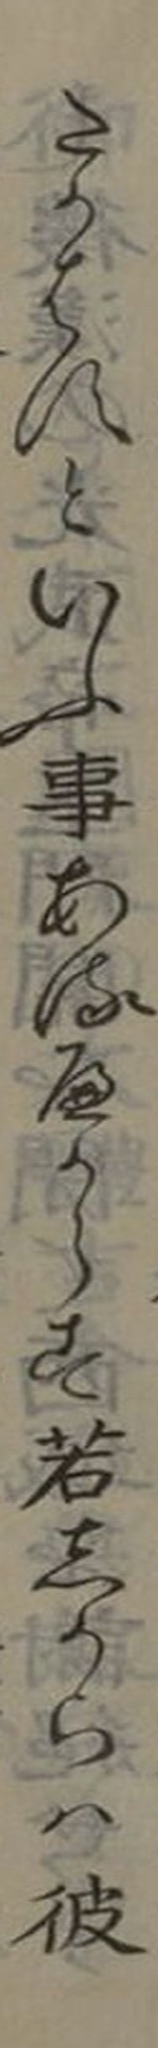たかはすといふ事あるへからす若しからは彼
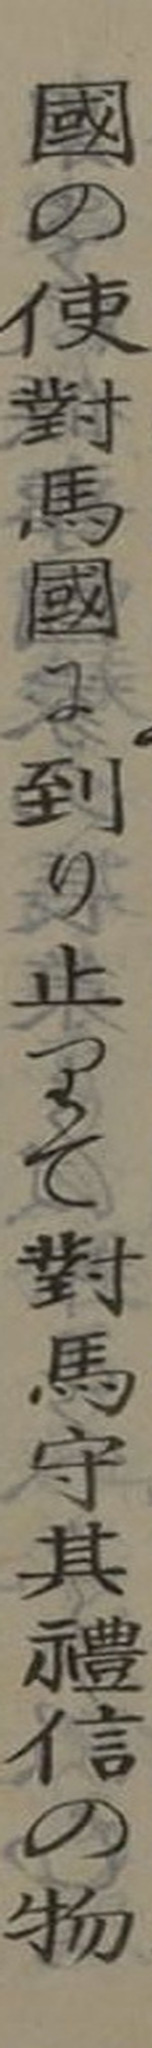國の使對馬國に到り止りて對馬守其禮信の物
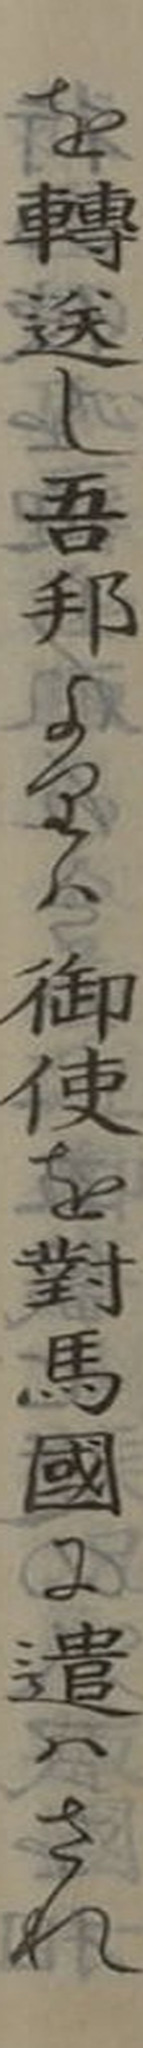を轉送し吾邦よりは御使を對馬國に遺はされ
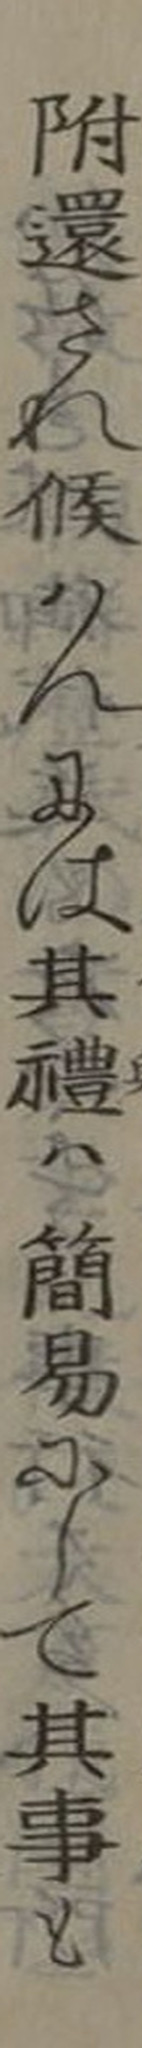附還され候はんには其禮は簡易にして其事も
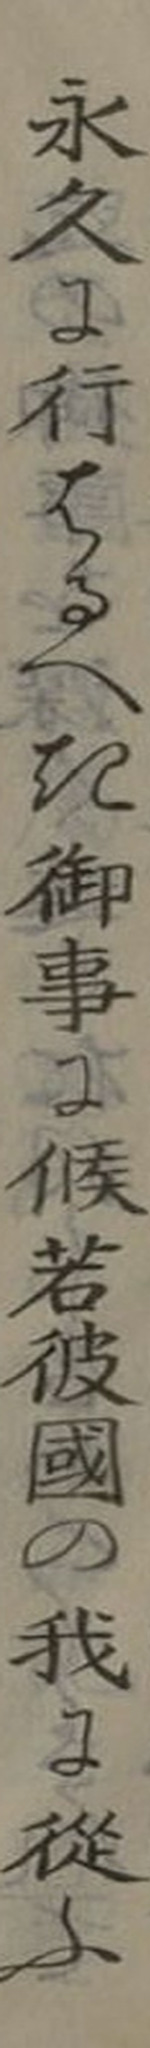永久に行はるへき御事に候若彼國の我に從ふ
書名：骨董録
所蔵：University of the Ryukyus Library
